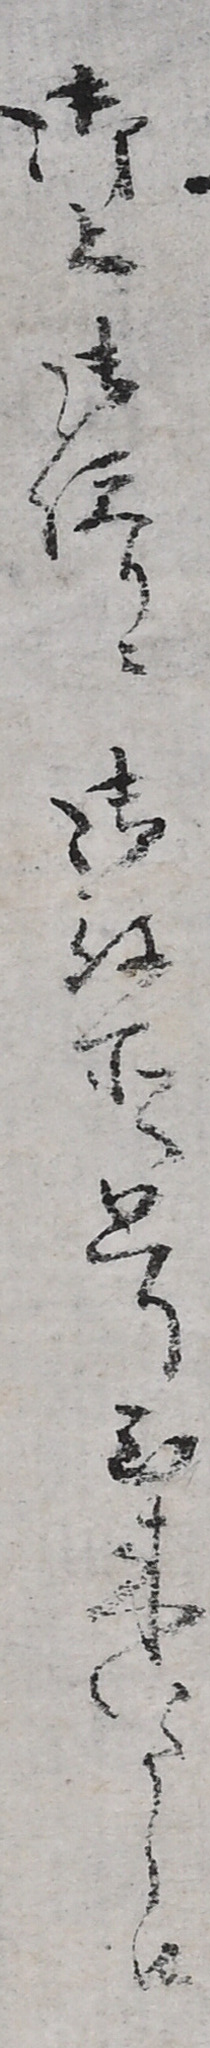御上御便りニ御役所江廻り至来いたし候
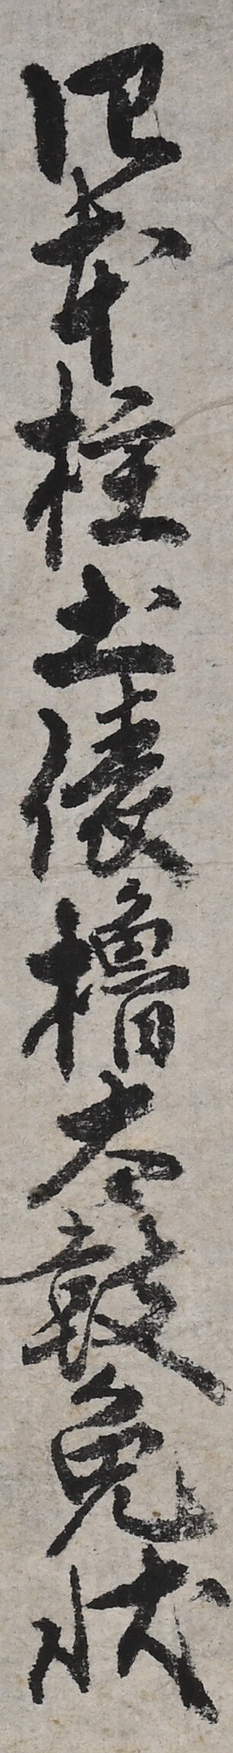四本柱土俵櫓太鼓免状写

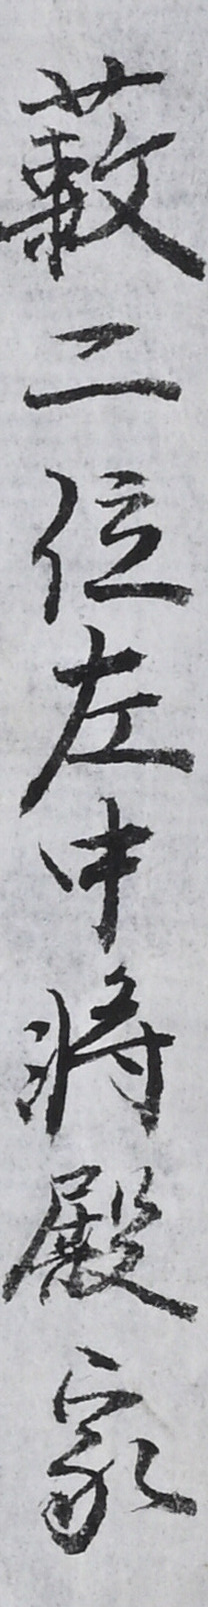藪二位佐中将殿家
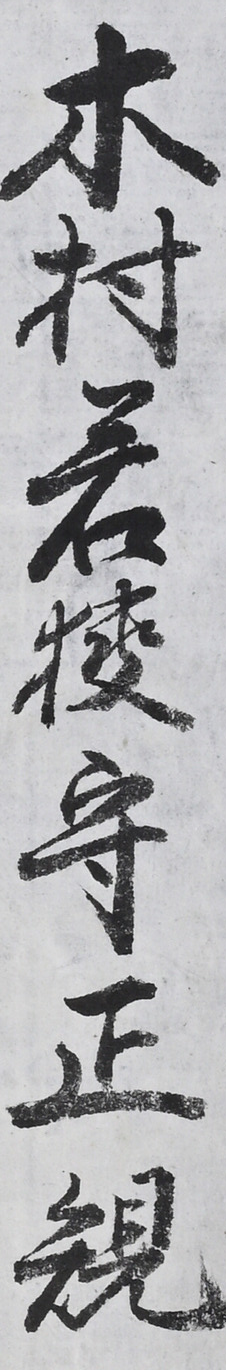木村若狭守正規
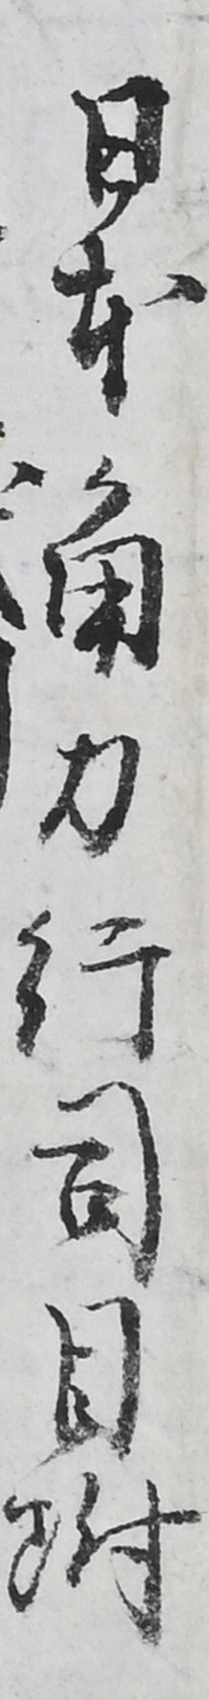日本角力行司目附
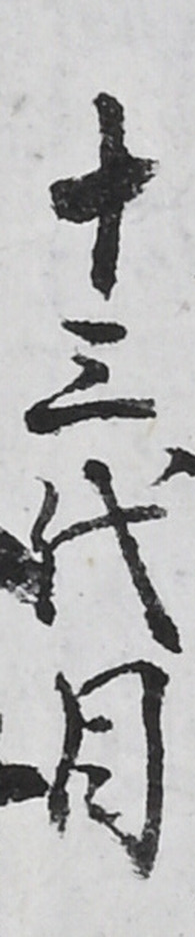十三代目
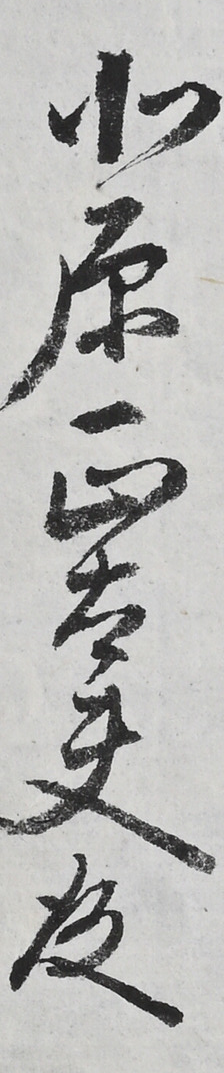北原正太夫殿
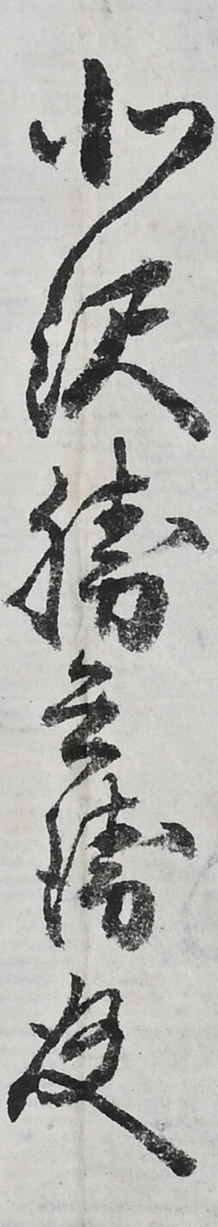北沢勝兵衛殿
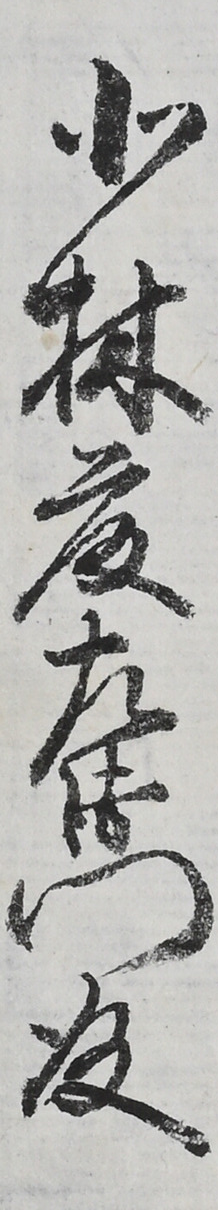小林藤左衛門殿
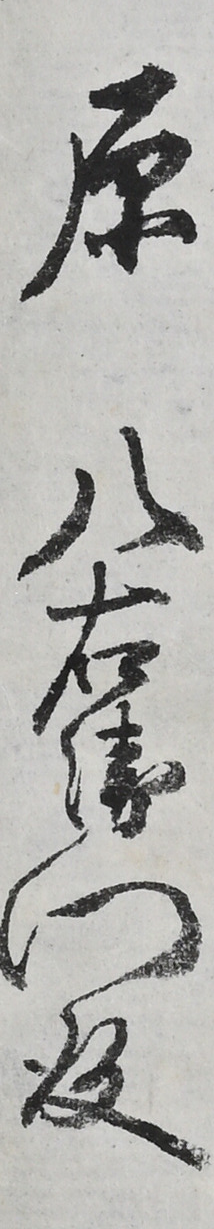原八右衛門殿
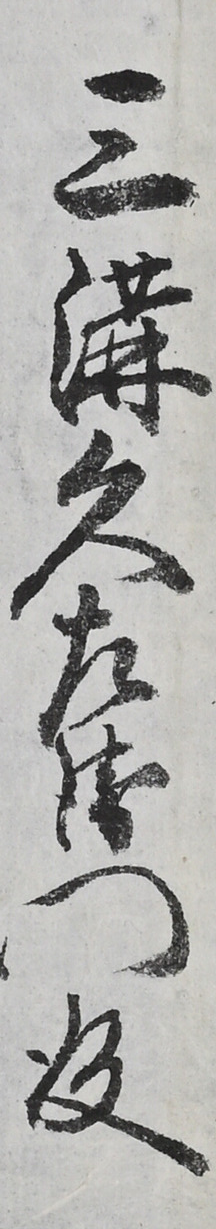三溝久左衛門殿
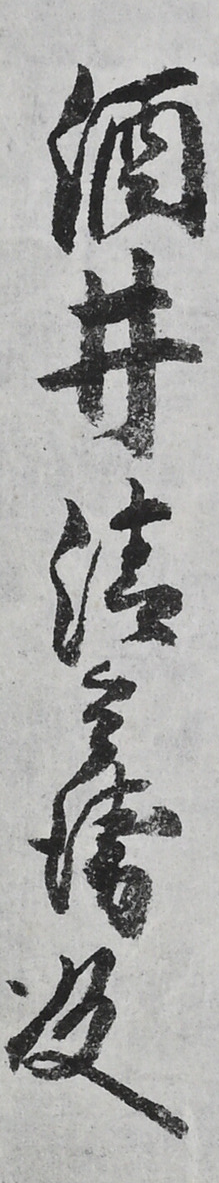酒井勝兵衛殿
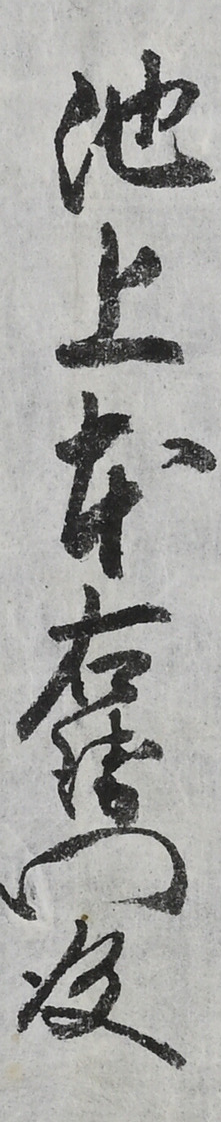池上本右衛門殿
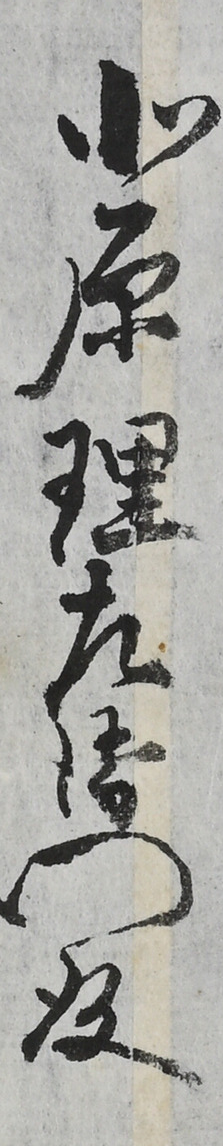小原理左衛門殿
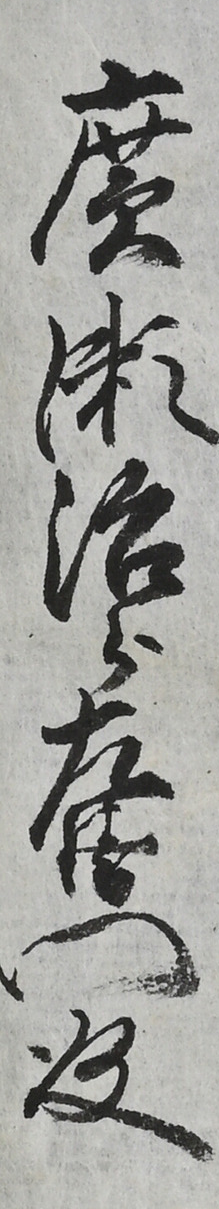広瀬治郎左衛門殿
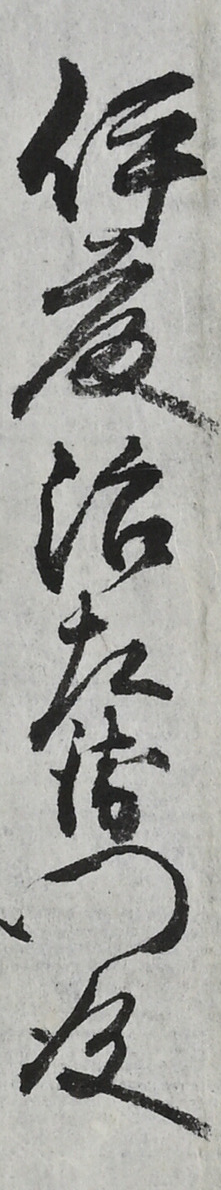伊藤治左衛門殿
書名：四本柱土俵櫓太鼓免状（写）
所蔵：伊那市立高遠町図書館・合同会社AMANE
